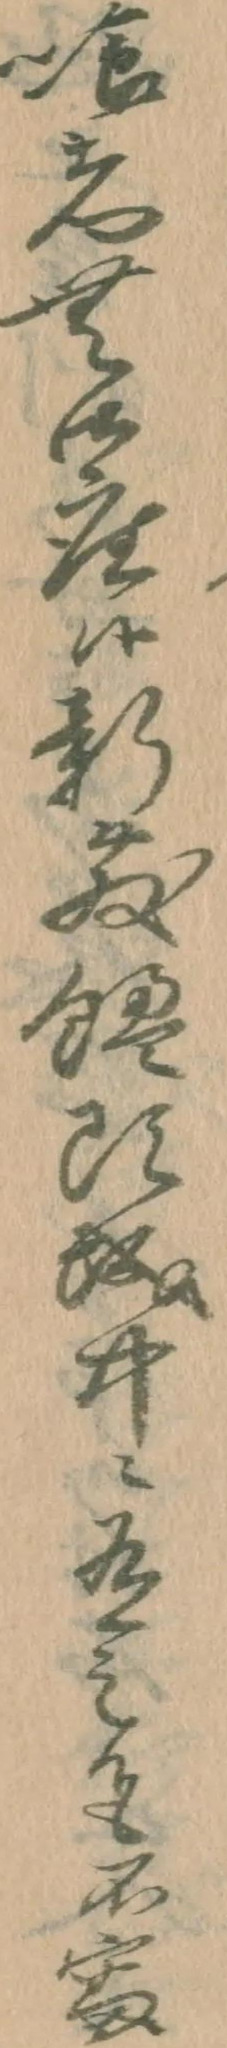喰者無御座候新敷饅頭城中へ有之候も不審
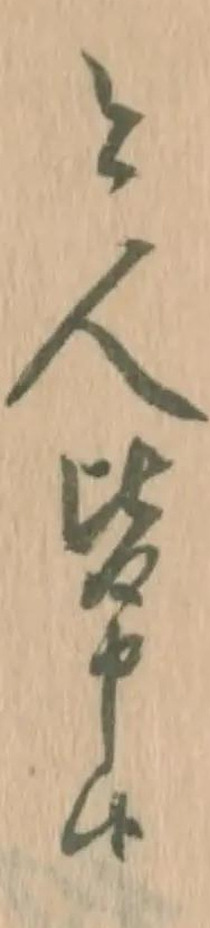と人皆申候
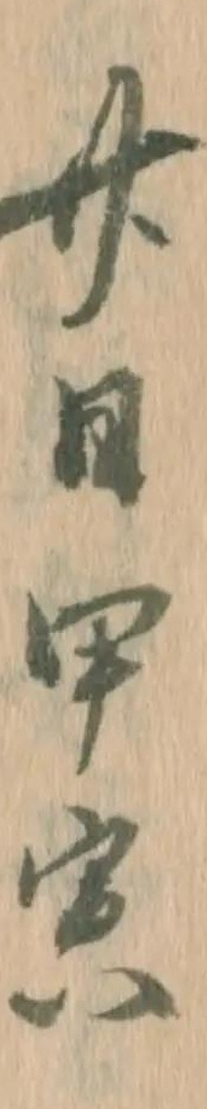廿日甲寅
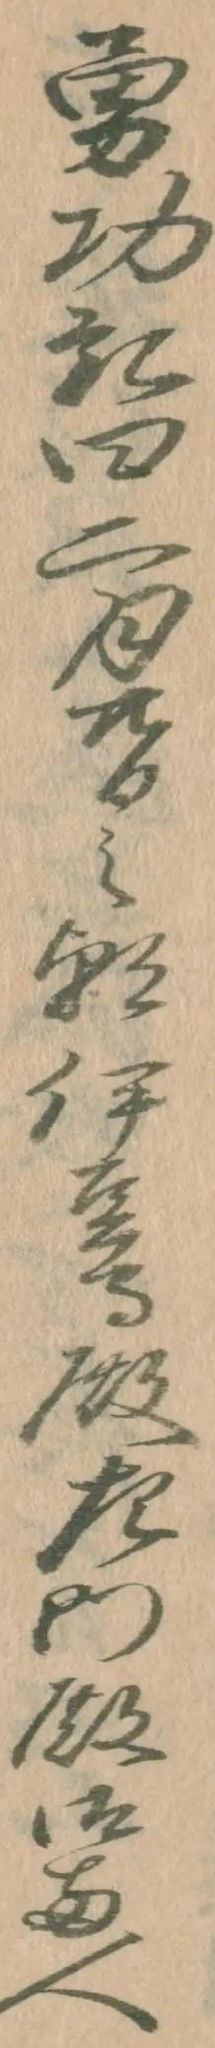勇功記曰二月廿日之朝伊豆守殿左門殿御両人
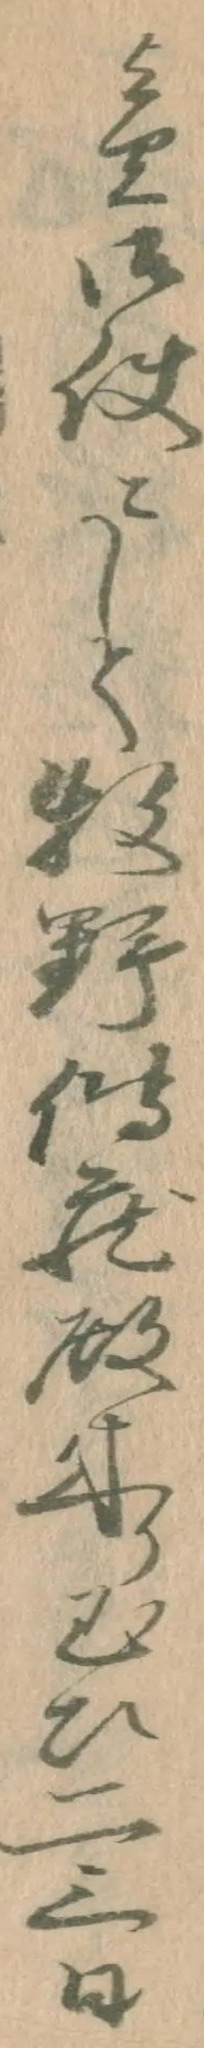与里御使にして牧野伝蔵殿来りわひ二三日
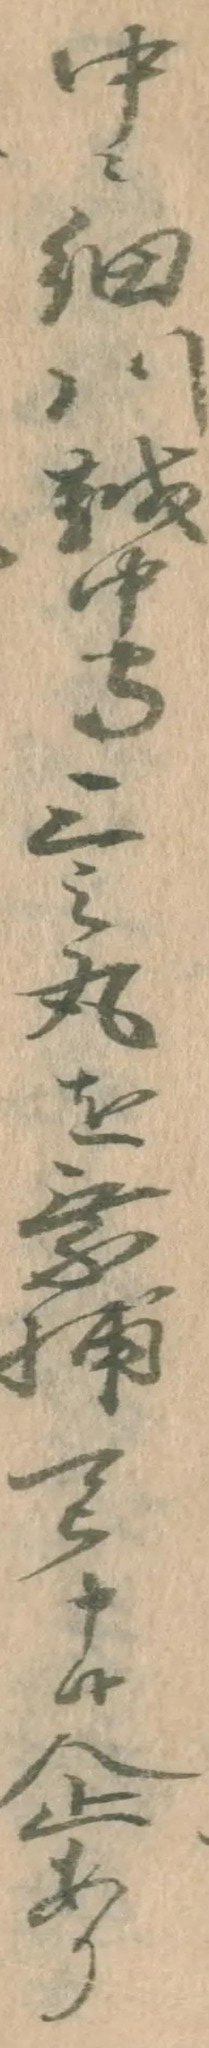中に細川越中守三之丸を乗捕可被申候企あり
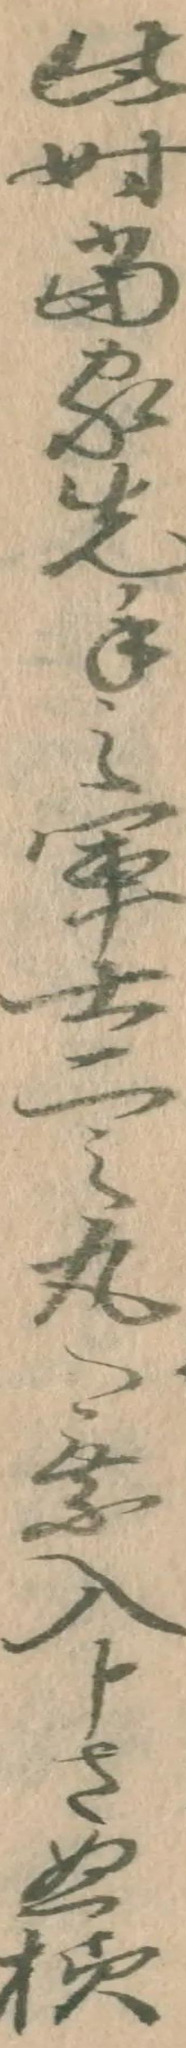此時当家先手之軍士二之丸へ乗入申さ怒様
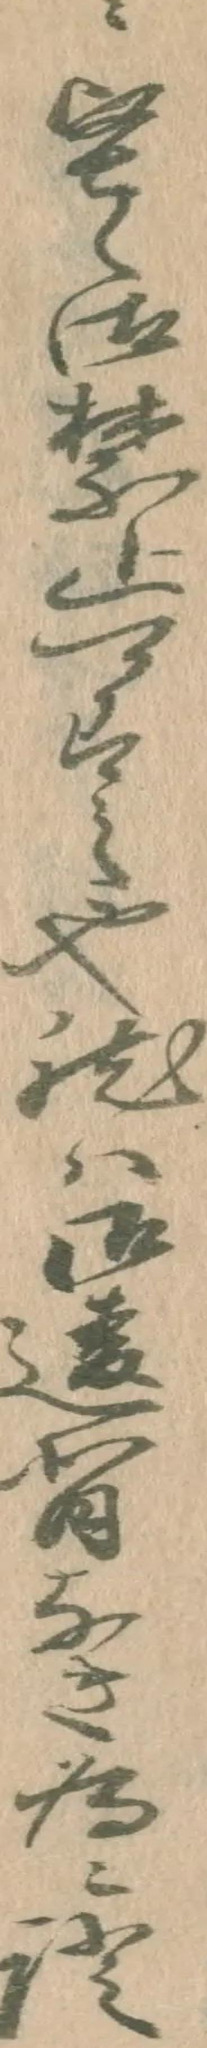に堅く御禁止可尽之也然は御違背なき為に證
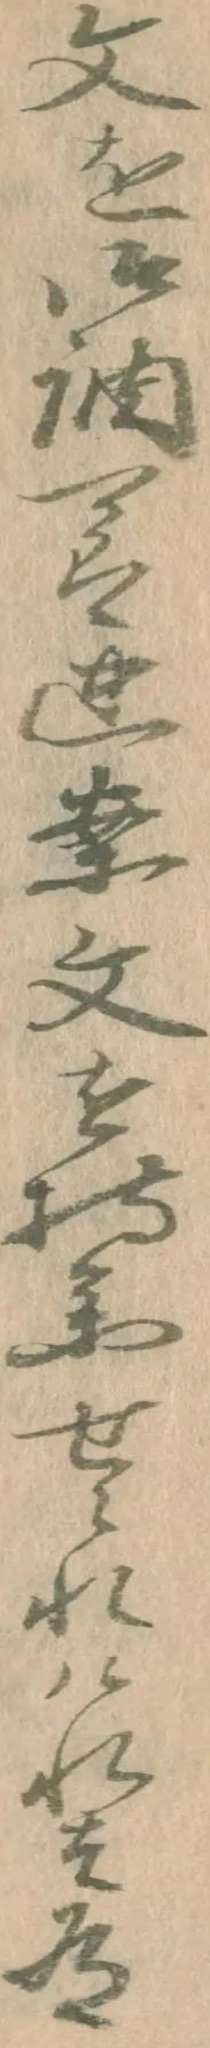文を御調可尽迚案文を持参せられけれ者有
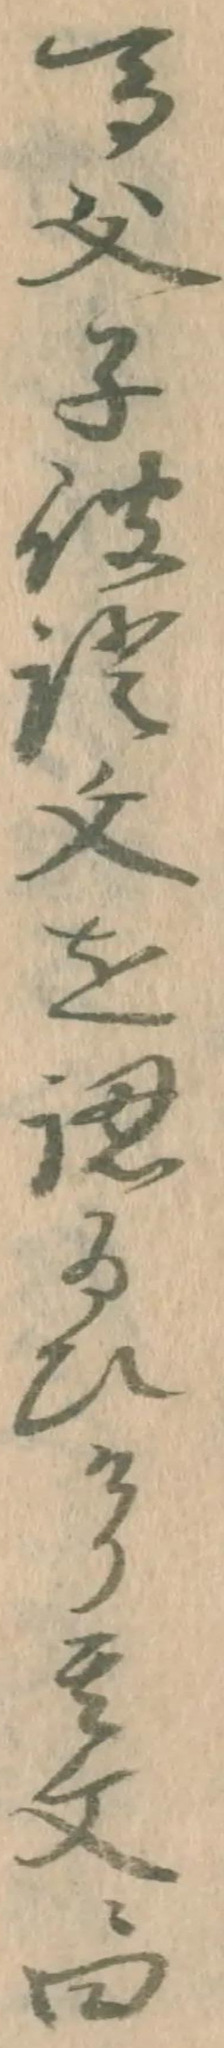馬父子彼證文を認るひけり其文に曰

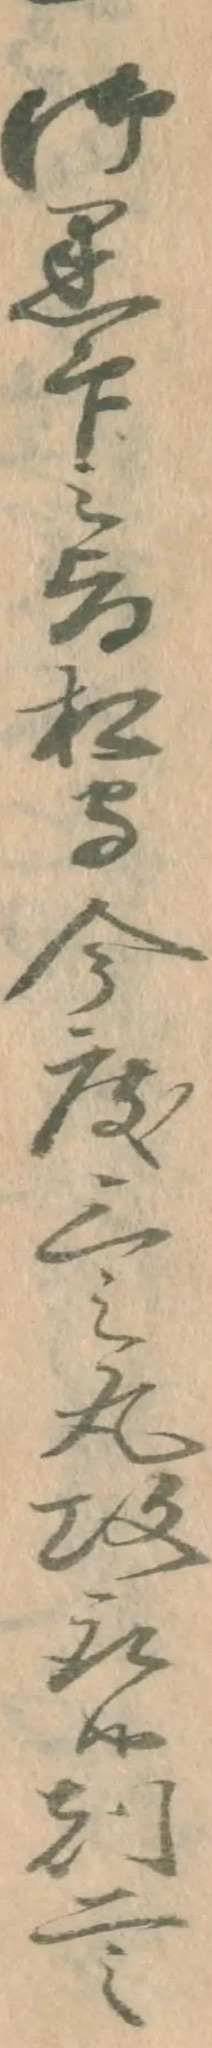一御黒印之旨相守今度三之丸攻取候刻二之
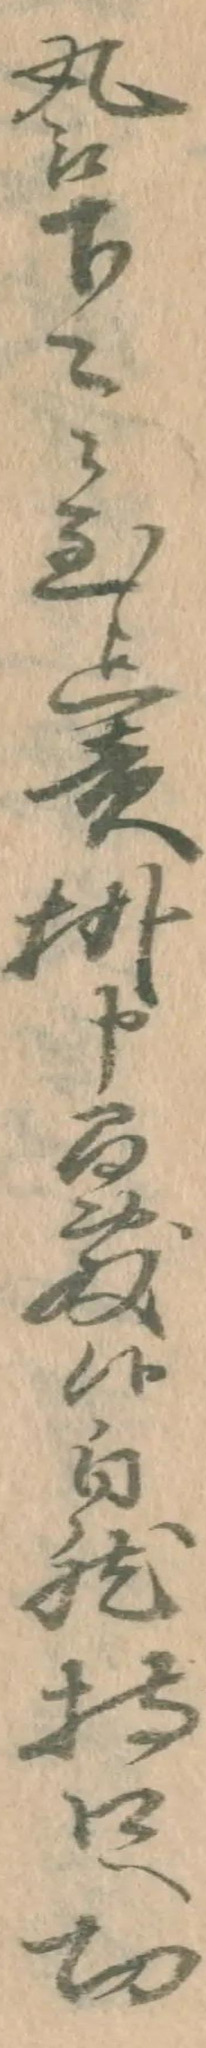丸江下々に至迄責掛申間敷候自然持口へ切
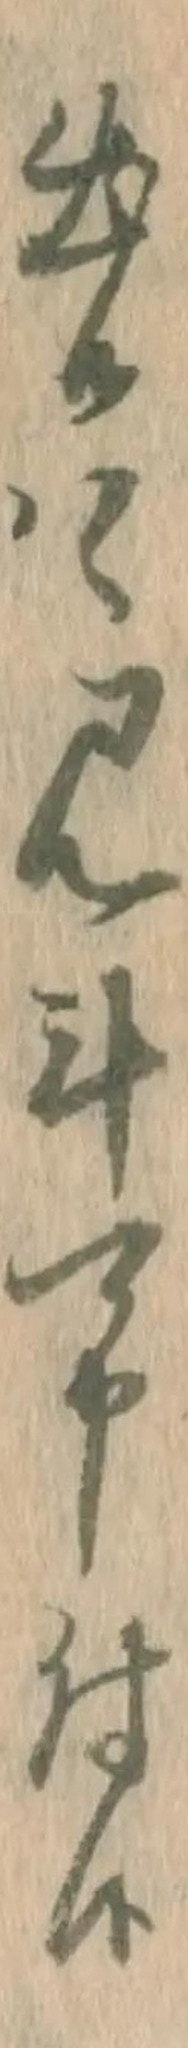出候はゝ見斗可申付候
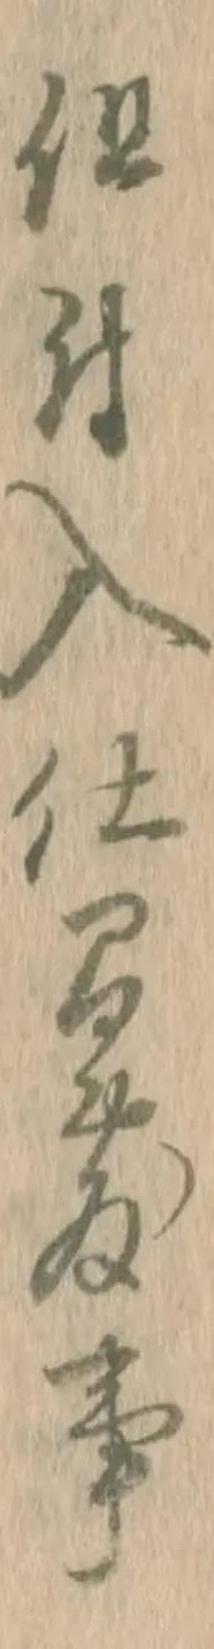但付入仕間敷事
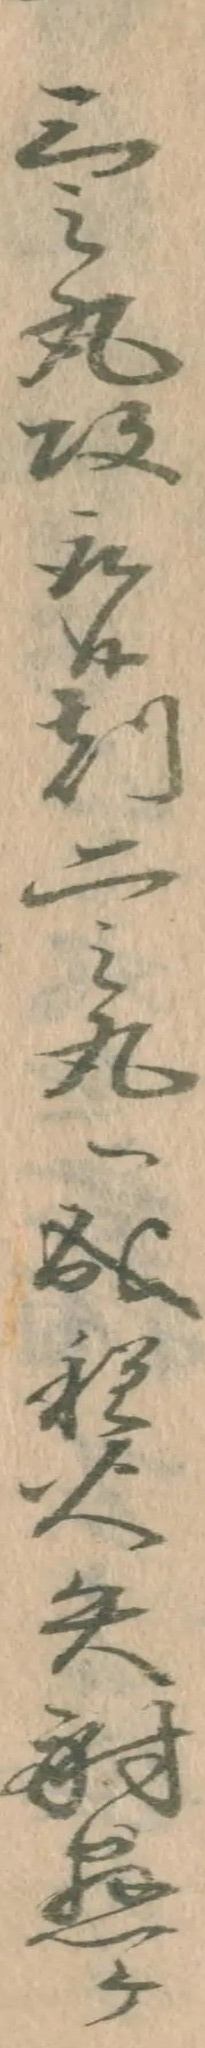一三之丸攻取候刻二之丸に成程火矢射懸け
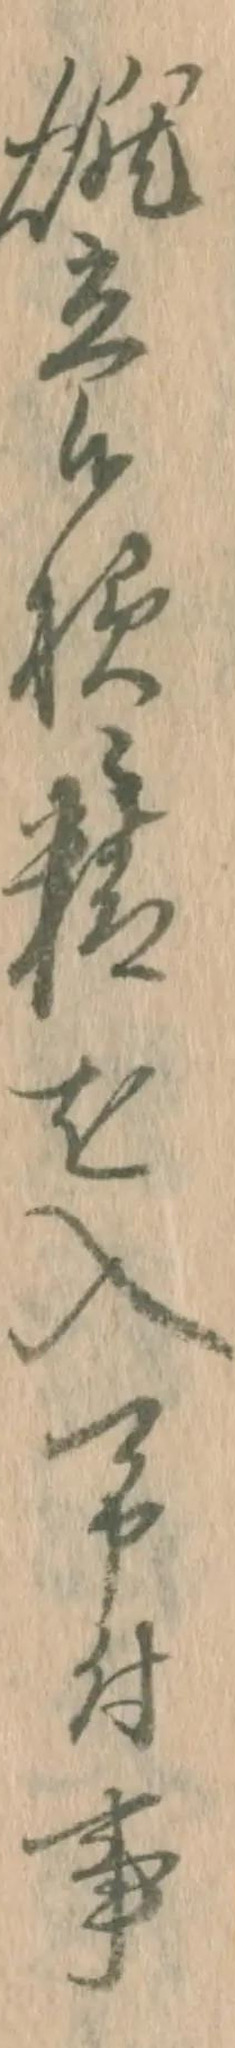燃立候様に精を入可申付事
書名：切支丹御退治記 49巻. [6]
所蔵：国立国会図書館 National Diet Library, JAPAN
